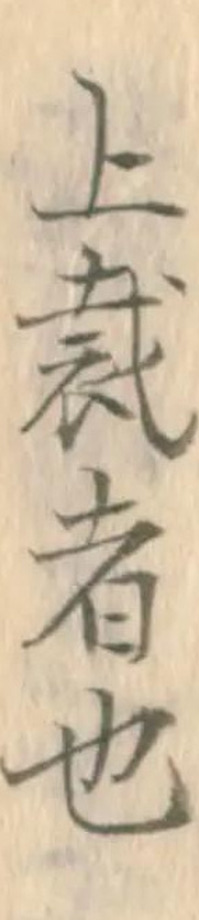上裁者也
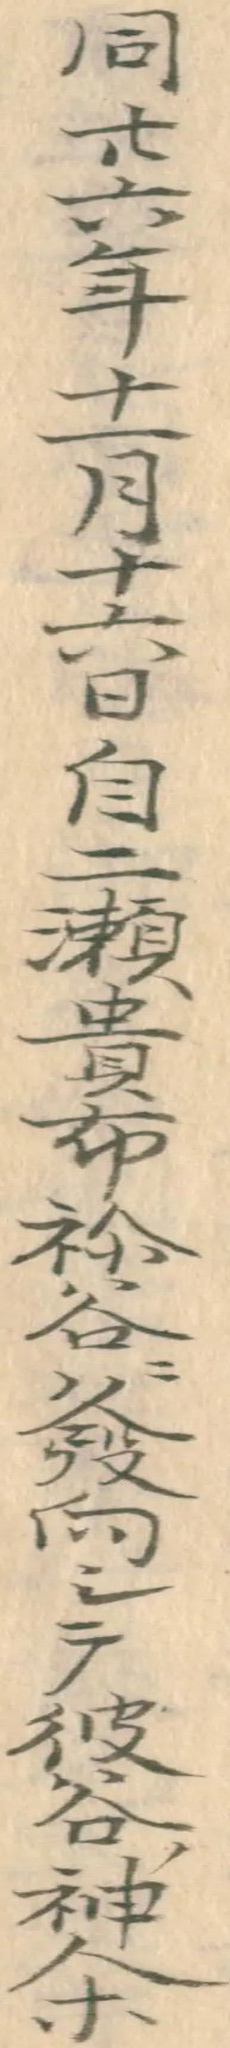同廿六年十一月十六日自二瀬貴布祢谷ニ発向シテ彼谷ノ神人等
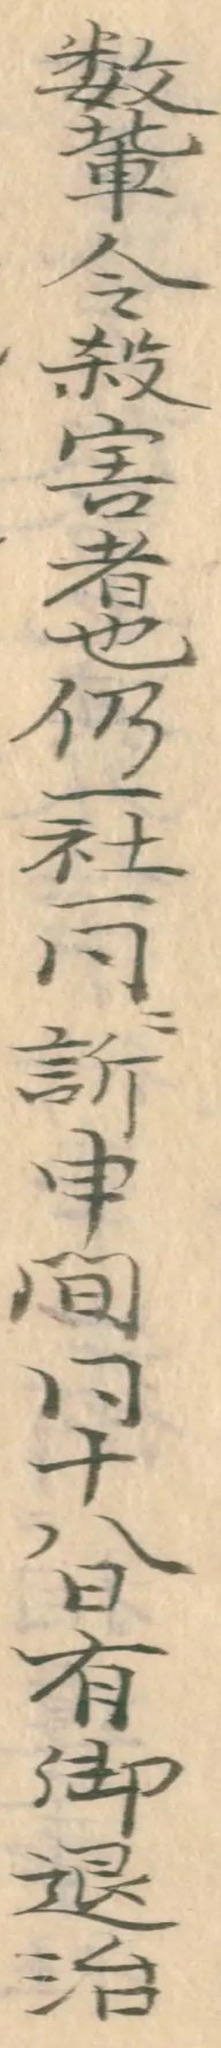数輩令殺害者也仍一社一同ニ訴申間同十八日有御退治
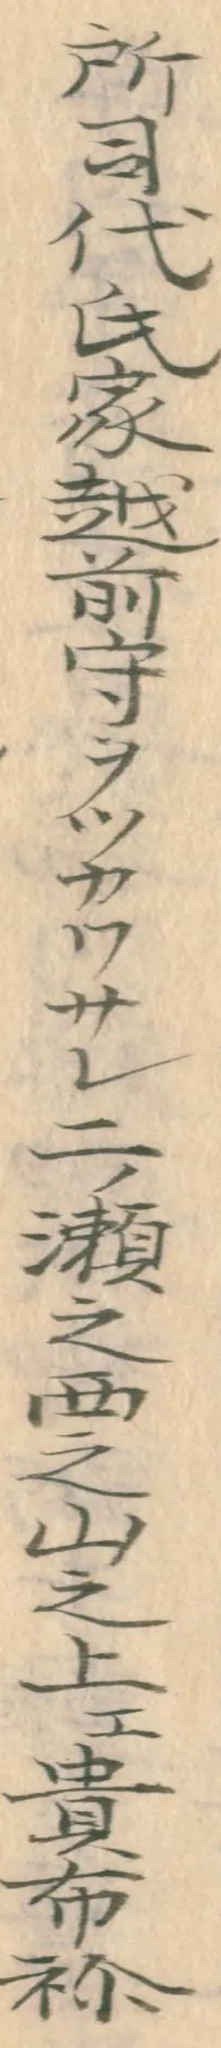所司代氏家越前守ヲツカワサレ二ノ瀬之西之山之上エ貴布祢
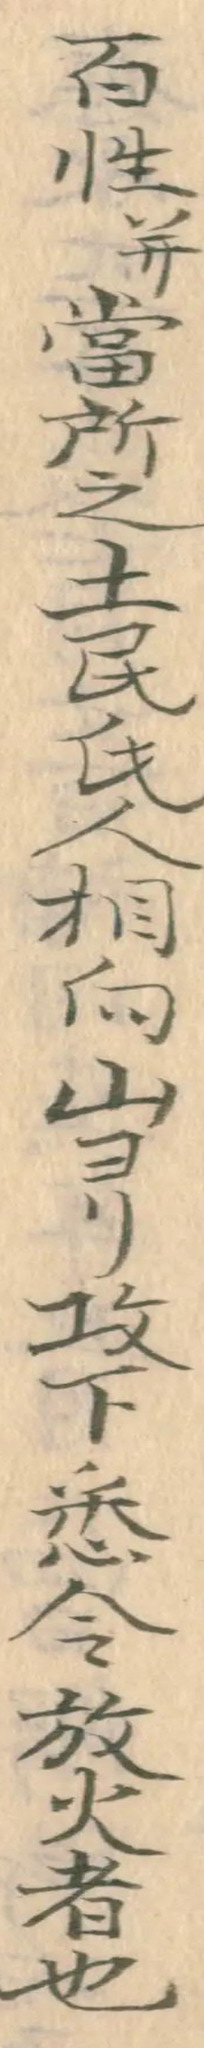百性并当所之土民氏人相向山ヨリ攻下悉令放火者也
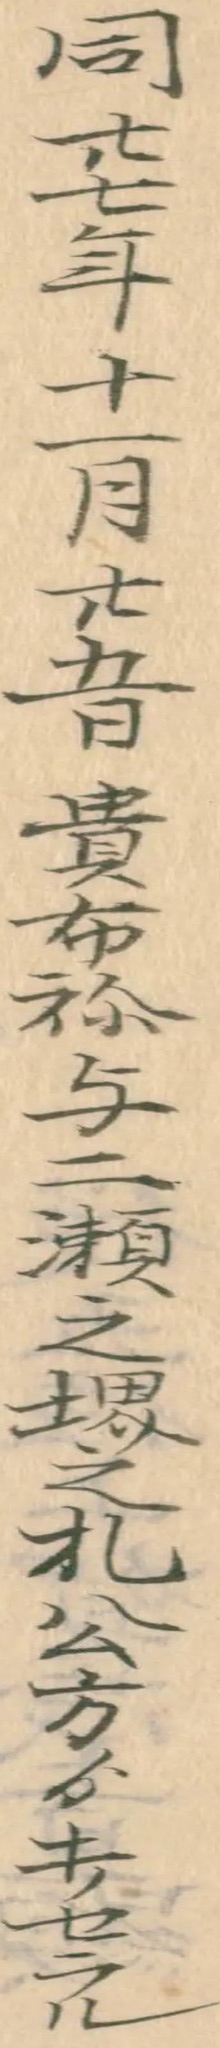同廿七年十一月廿五日貴布祢与二瀬之堺之札公方ゟ打セラル
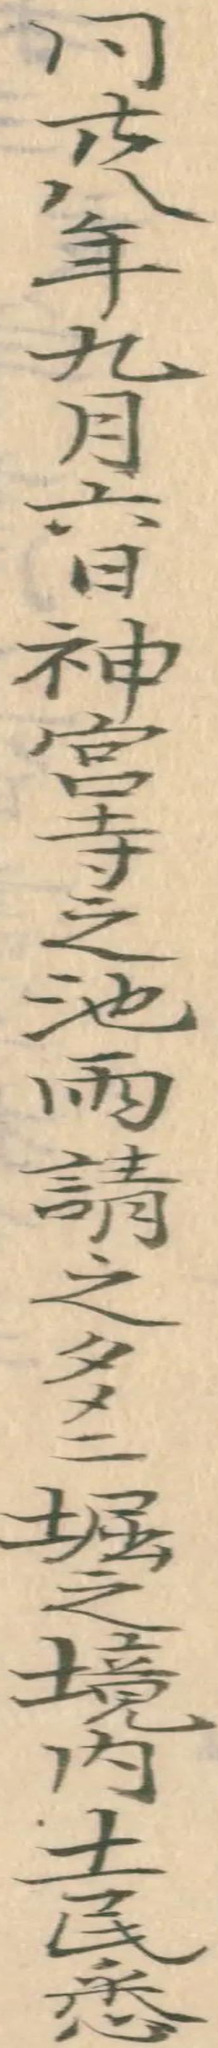同廿八年九月六日神宮寺之池雨請之夕メニ堀之境内土民悉
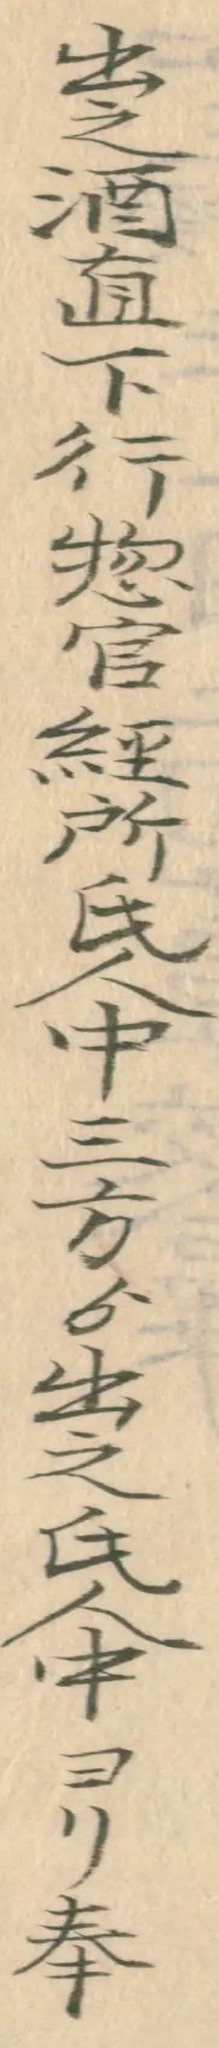出之酒直下行惣官経所氏人中三方ゟ出之氏人中ヨリ奉
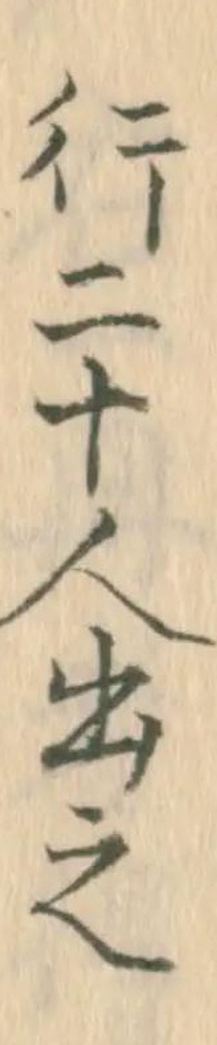行二十人出之
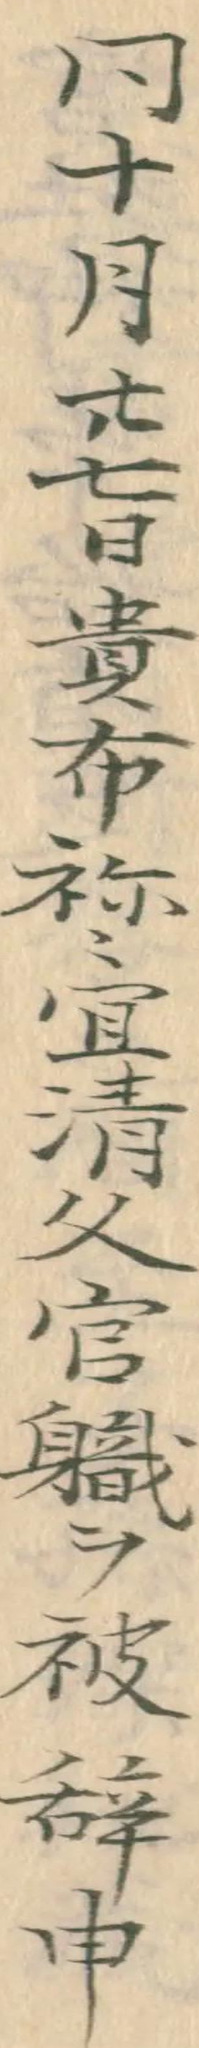同十月廿七日貴布祢々宜清久官職ヲ被辞申
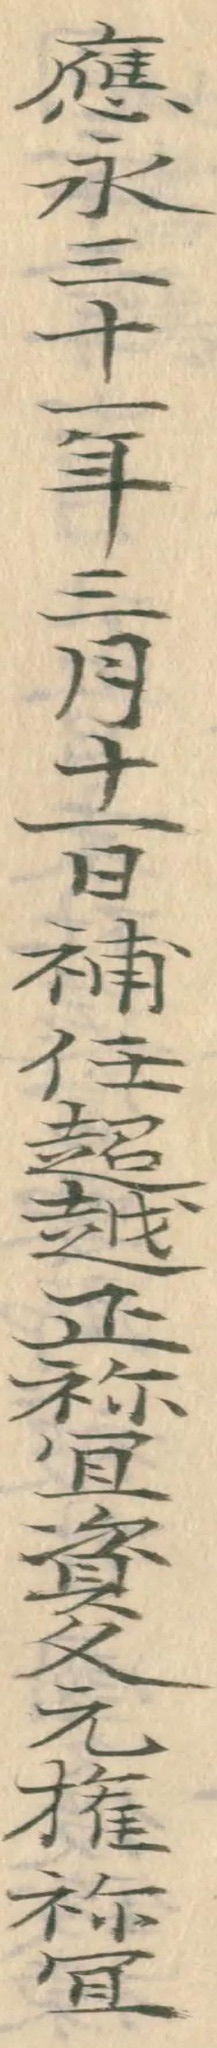応永三十一年三月十一日補任超越正祢宜資久元権祢宜
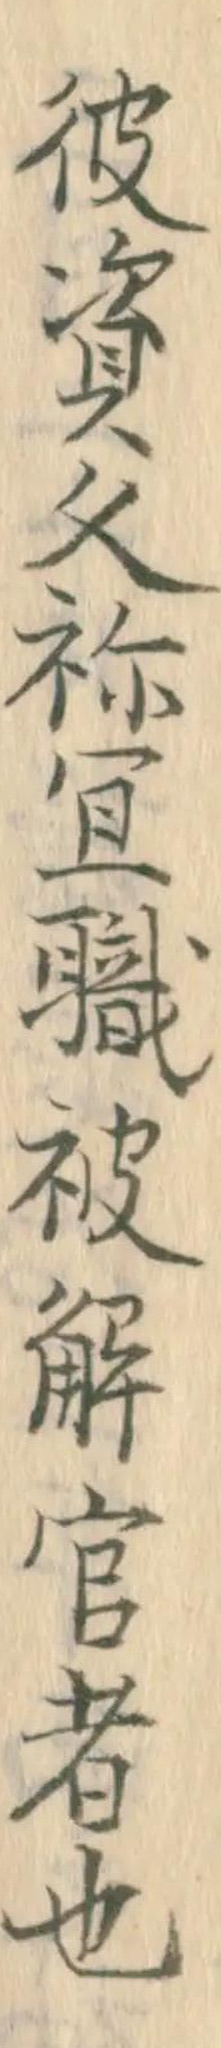彼資久祢宜職被解官者也
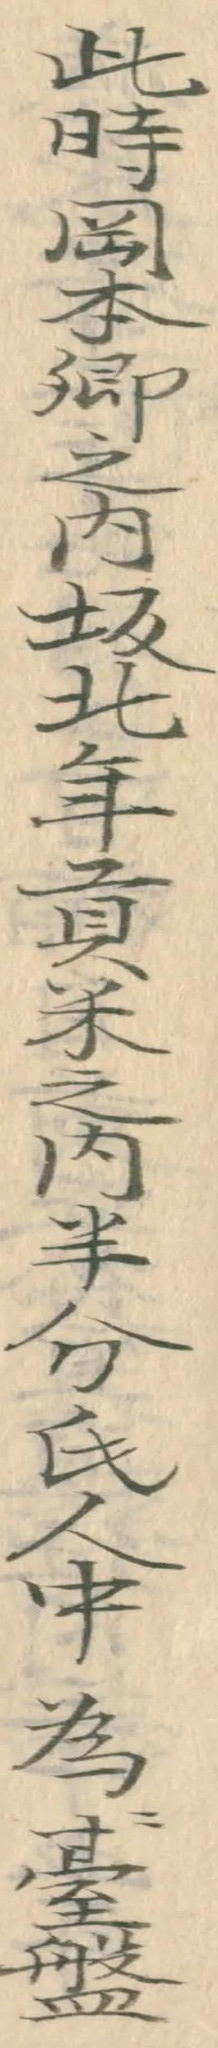此時岡本郷之内坂北年貢米之内半分氏人中為ニ台盤
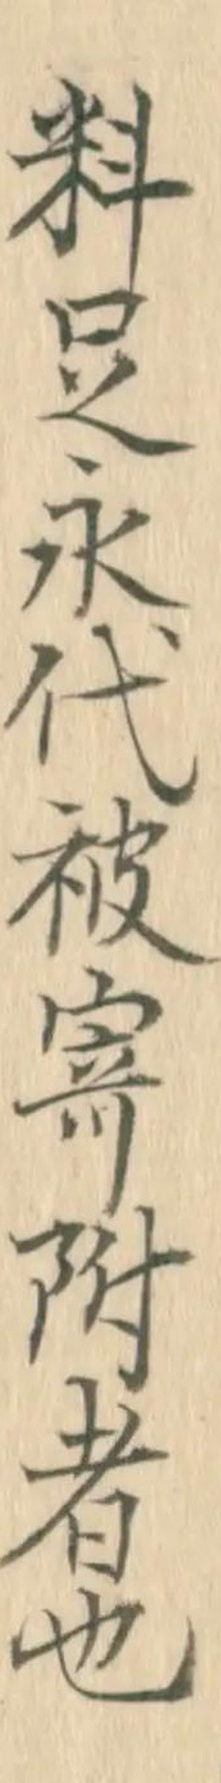料足永代被寄附者也
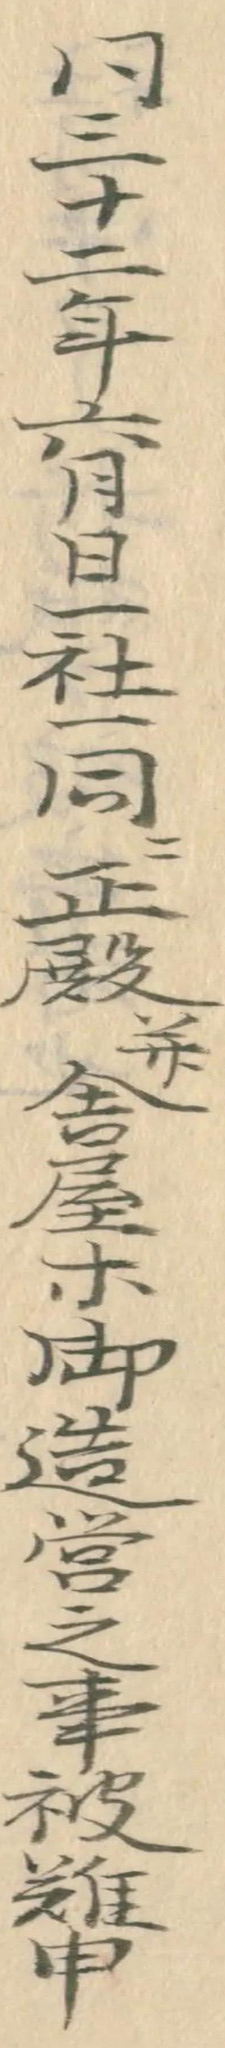同三十二年六月日一社一同ニ正殿并舎屋等御造営之事被難申
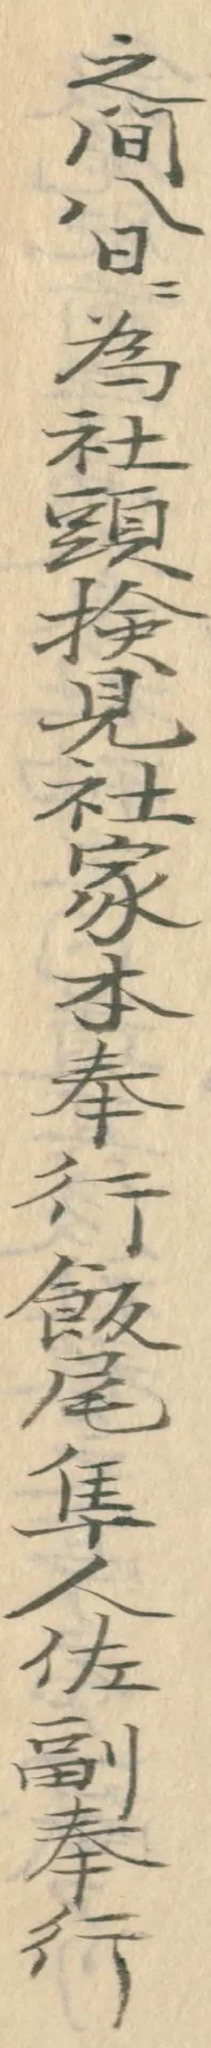之間八日ニ為社頭検見社家本奉行飯尾隼人佐副奉行
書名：賀茂社記録. 第24冊
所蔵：国立国会図書館 National Diet Library, JAPAN
